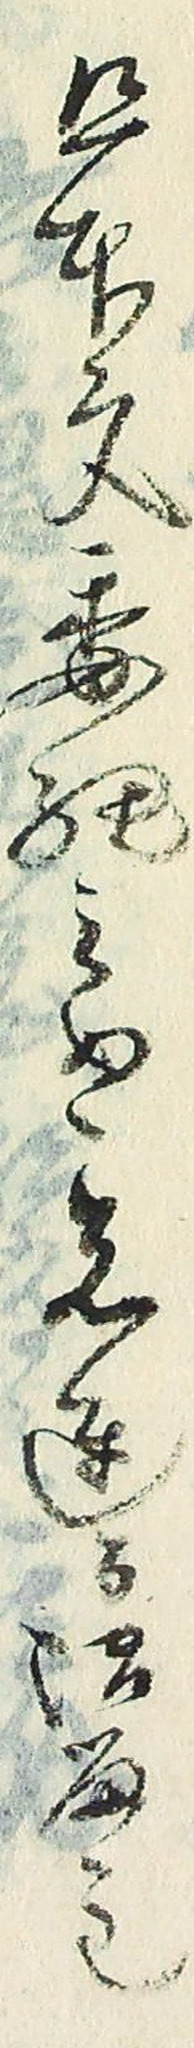且本文委細之義先達而御留主
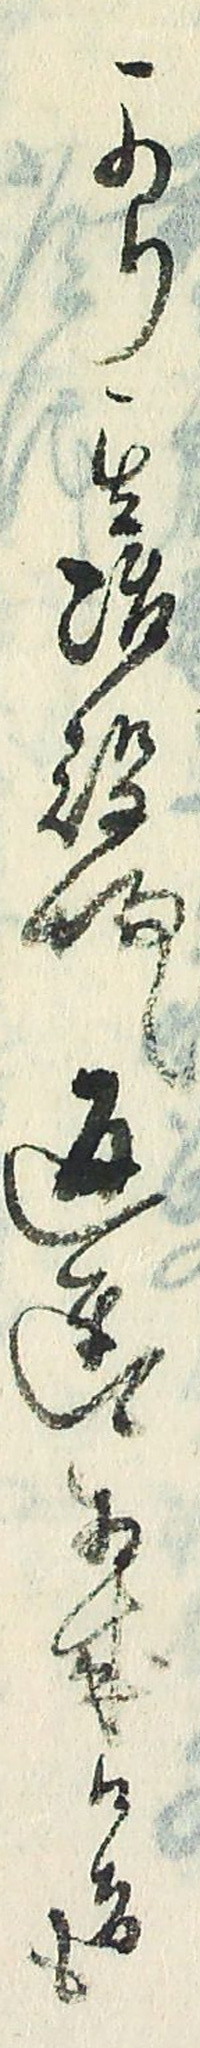より其御役塲へ通達ニ相成候旨も
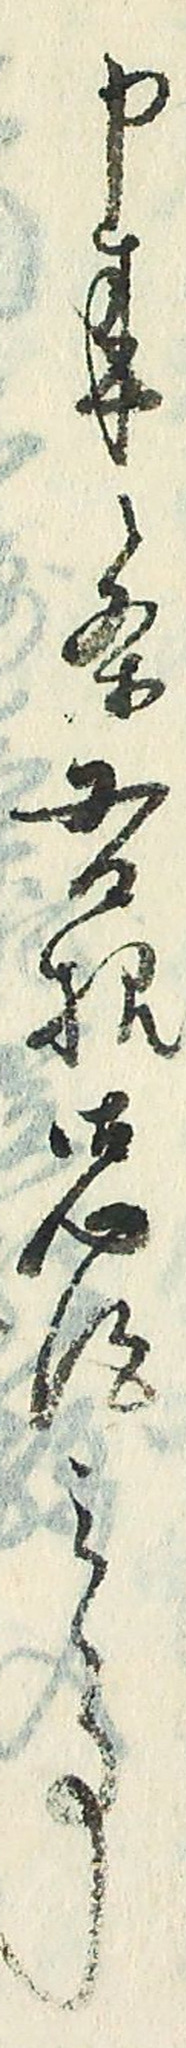申来候条右様御心得之事

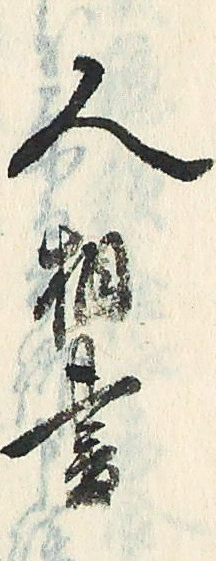人相書
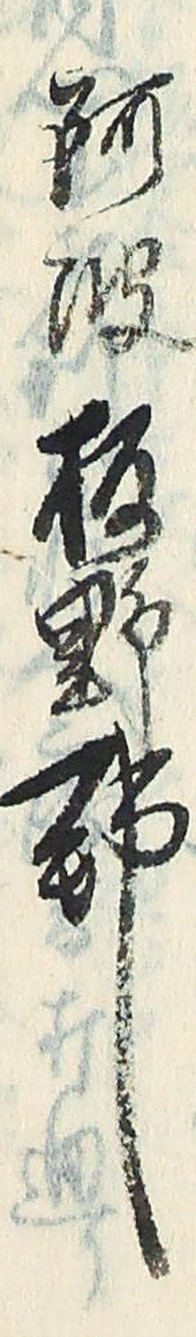阿波板野郡
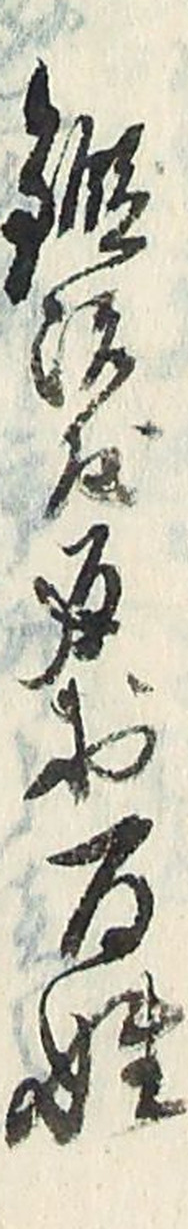鍛冶屋原村百姓
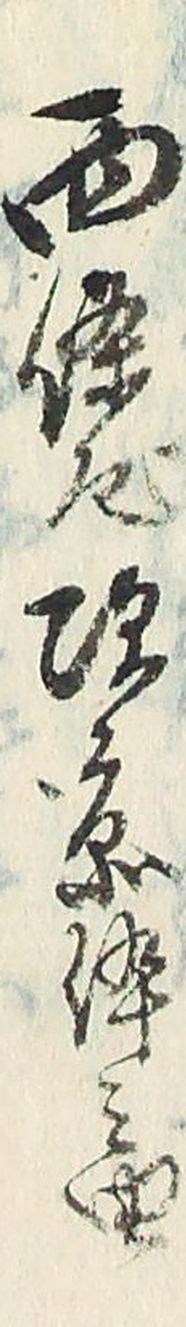西條屋次兵衛伜之由
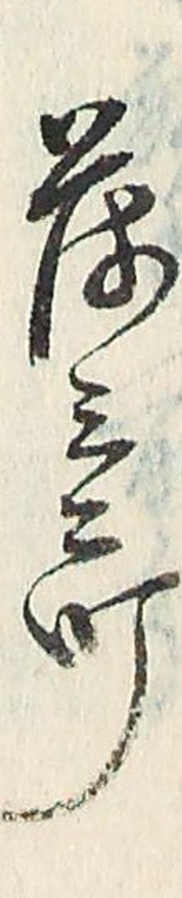茂三郎
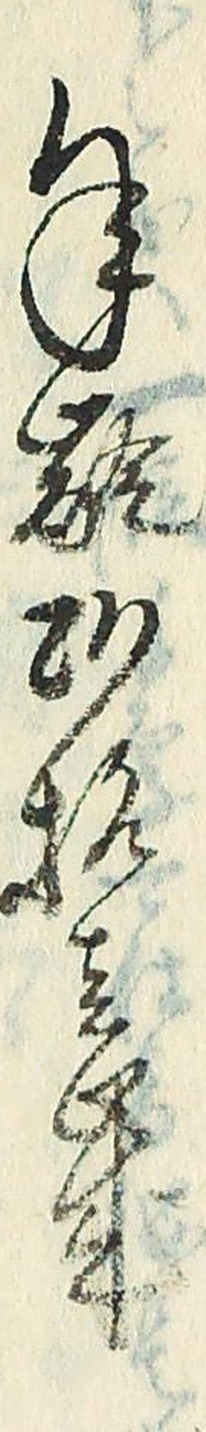年齢弐拾壱歳
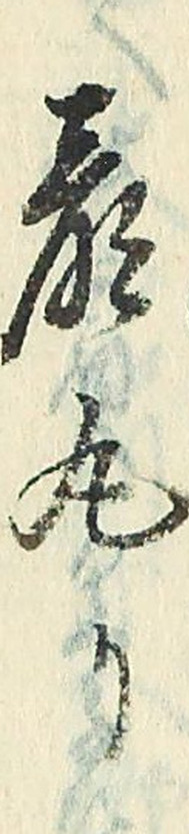顔丸ク
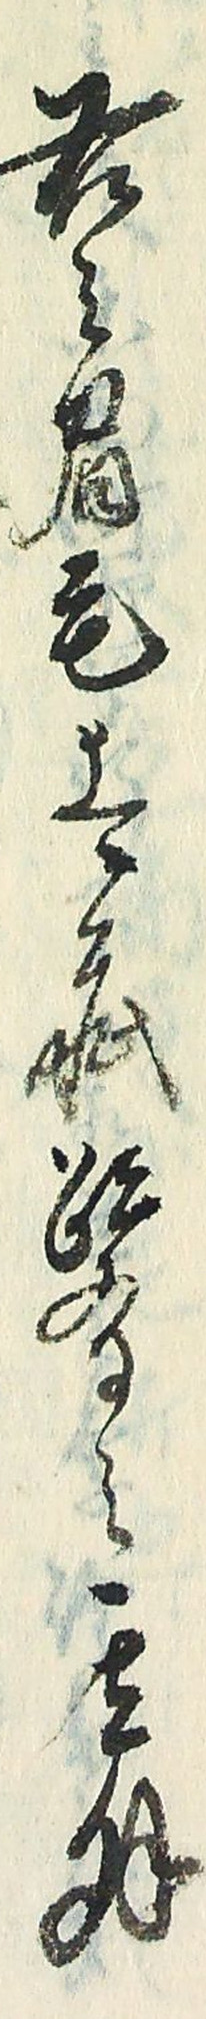右之眉毛上ニ疵跡有之其外
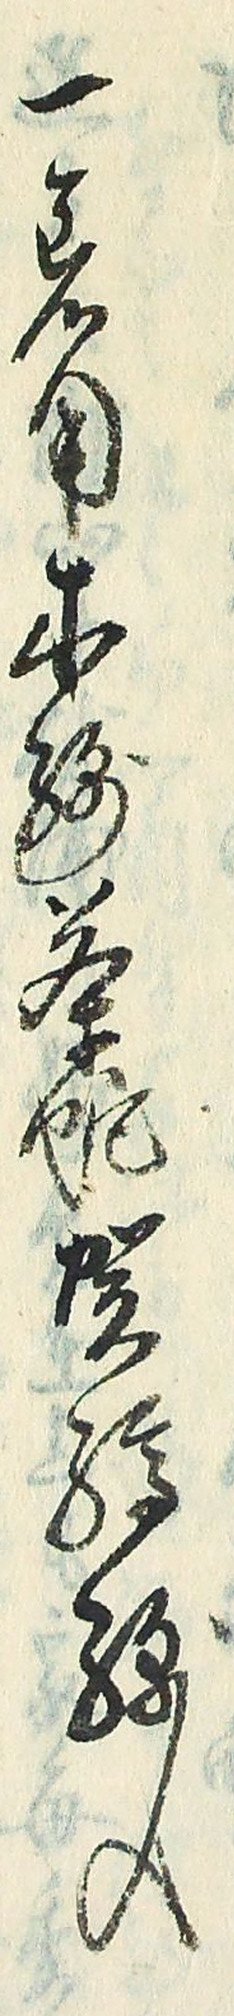一着用木綿茶蛇賀縞綿入
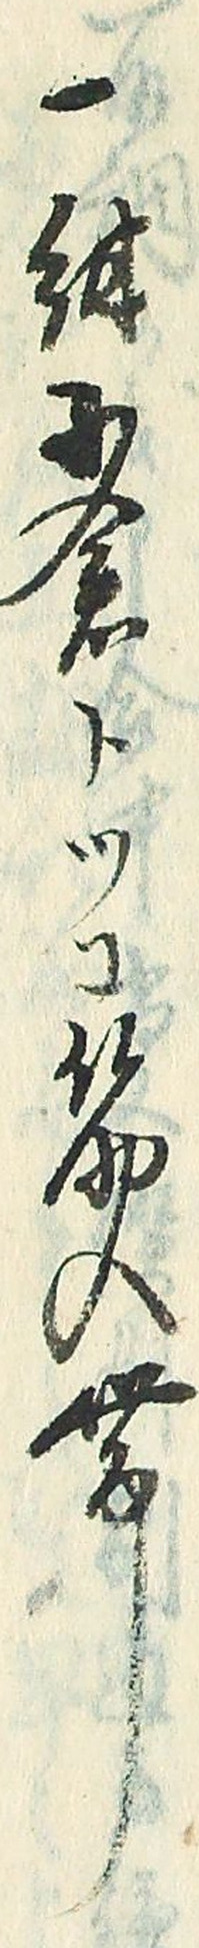一紺小倉トツコ筋入帯

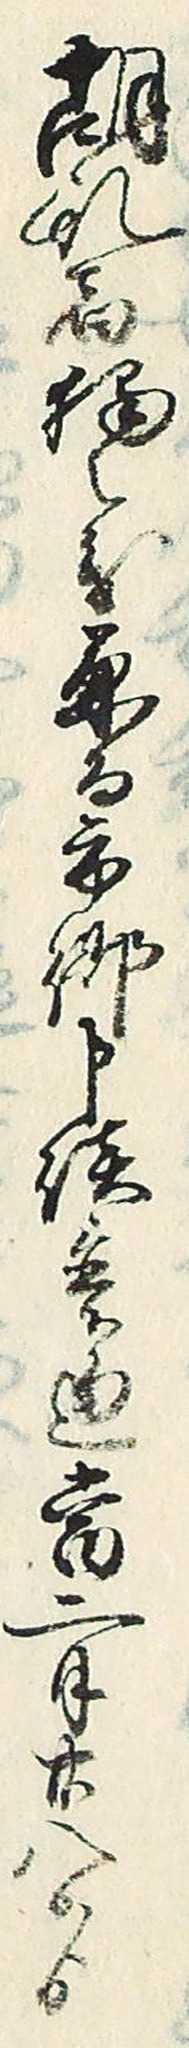胡乱者狩之義兼而市郷申談置候通當二月廿八日ゟ
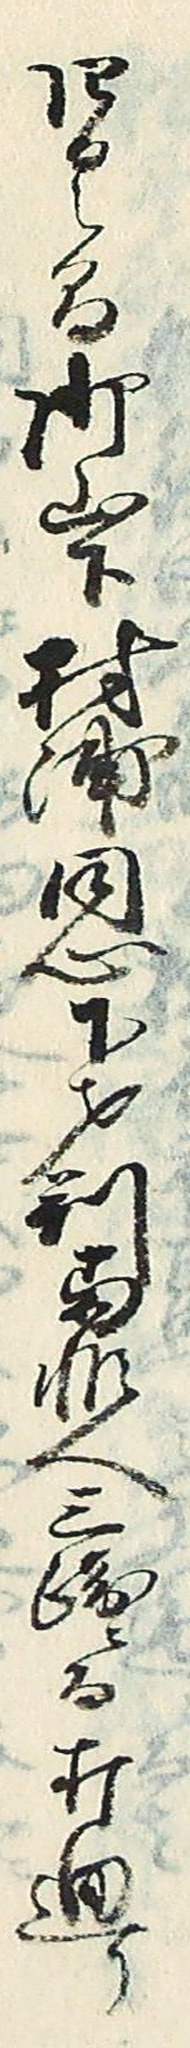四日之間御山下村浦同心下才判番非人三崎ニ而打廻り
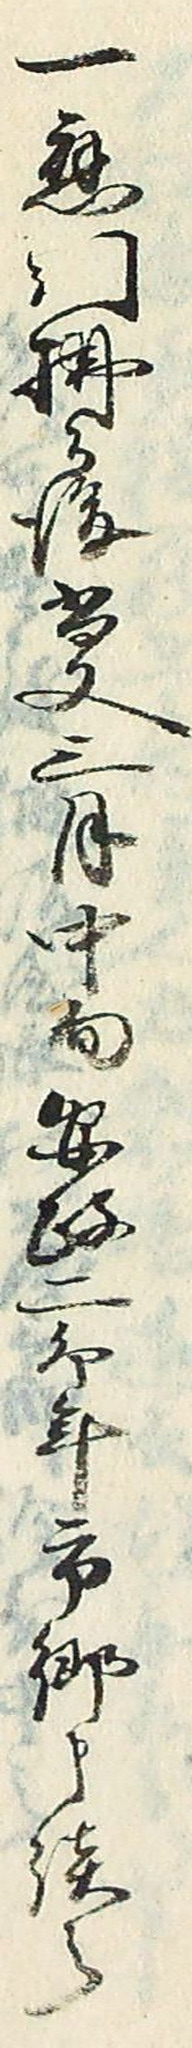一應引拂候後尚又三月中旬安政二卯年市郷申談之
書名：諸御趣意書并御下知向之写
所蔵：鳴門教育大学 Naruto University of Education
